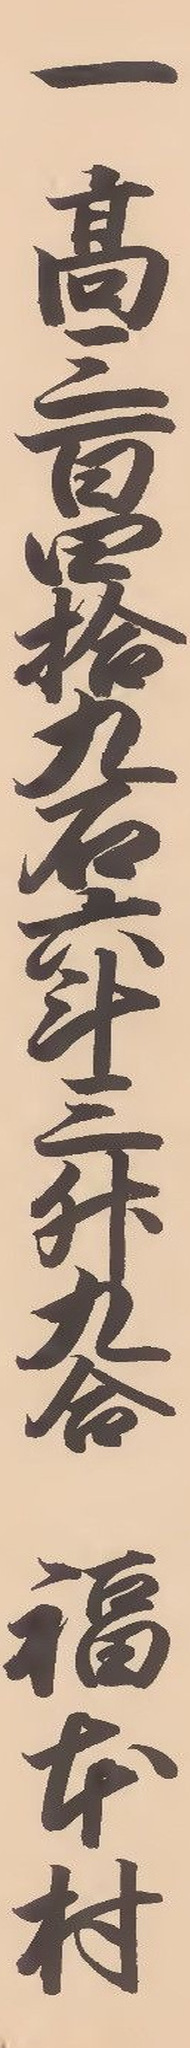一高三百四拾九石六斗三升九合福本村
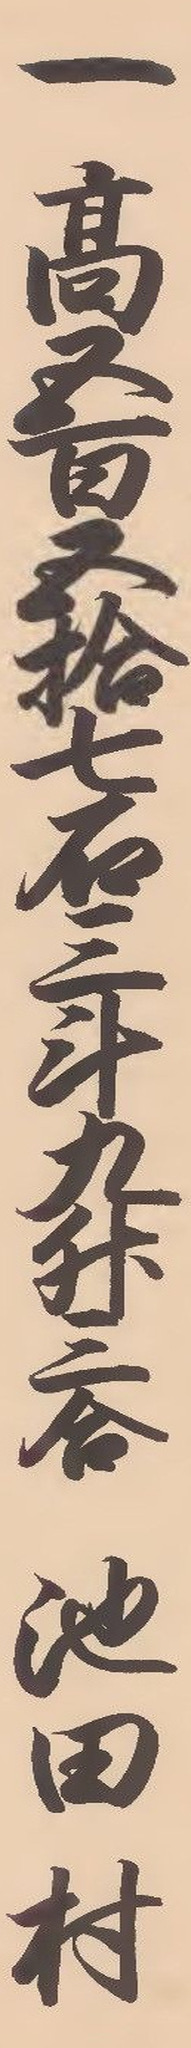一高五百五拾七石三斗九升三合池田村
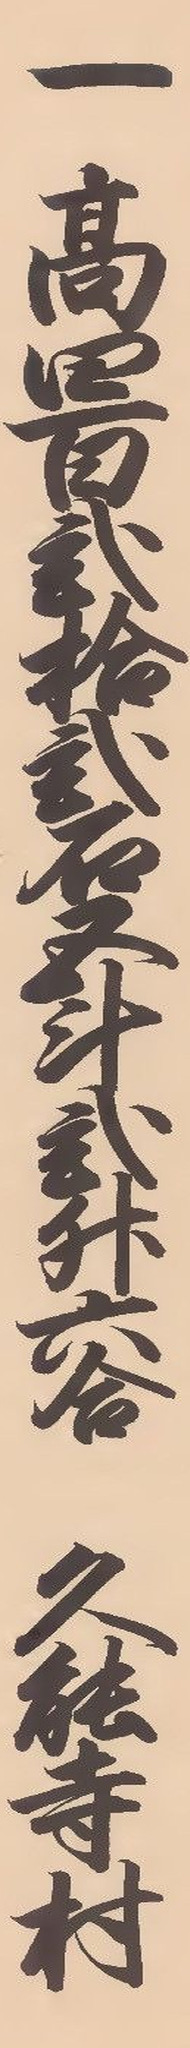一高四百弐拾弐石五斗弐升六合久能寺村
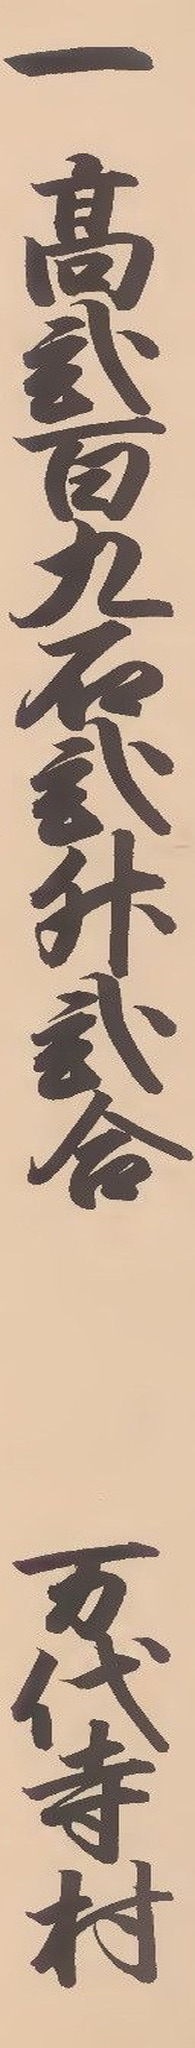一高弐百九石弐升弐合万代寺村
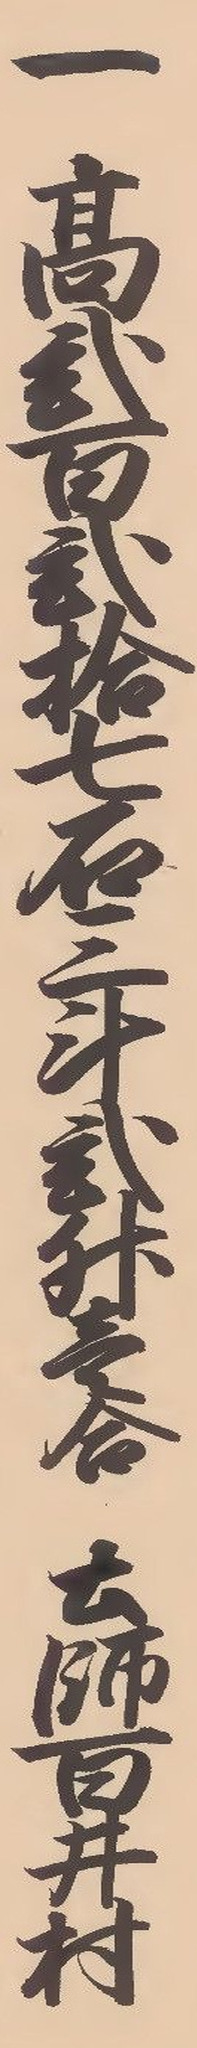一高弐百弐拾七石三斗弐升壱合土師百井村
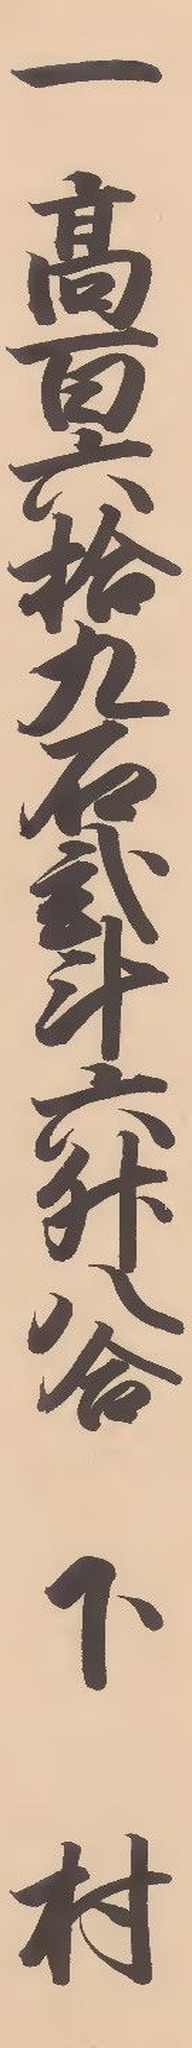一高百六拾九石弐斗六升八合下村
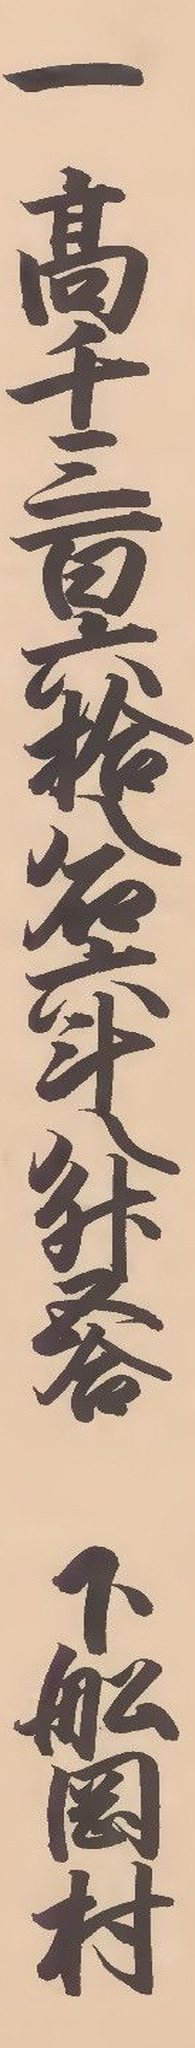一高千三百六拾八石六斗八升五合下船岡村

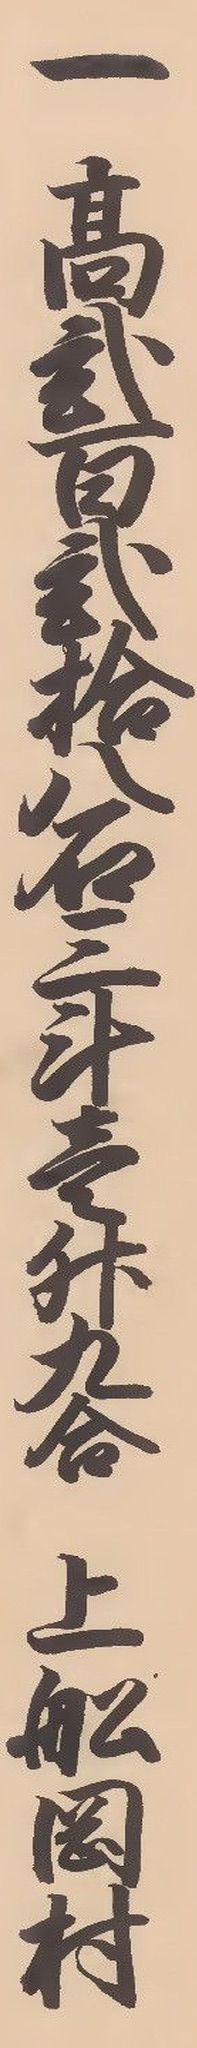一高弐百弐拾八石三斗壱升九合上船岡村
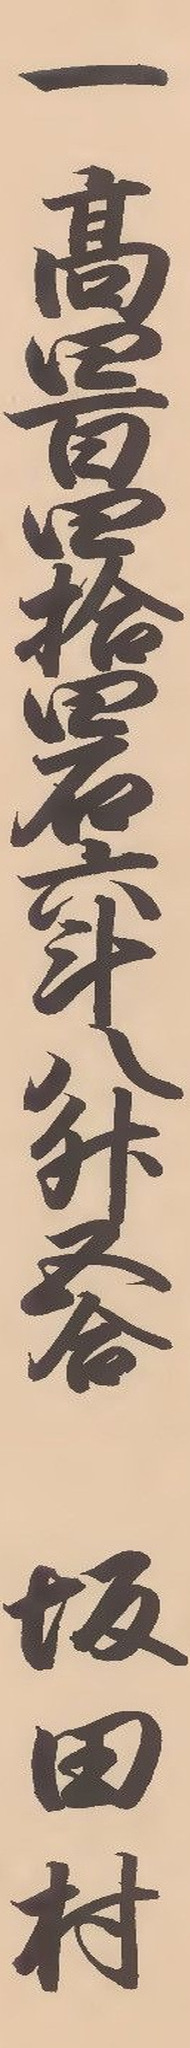一高四百四拾四石六斗八升五合坂田村
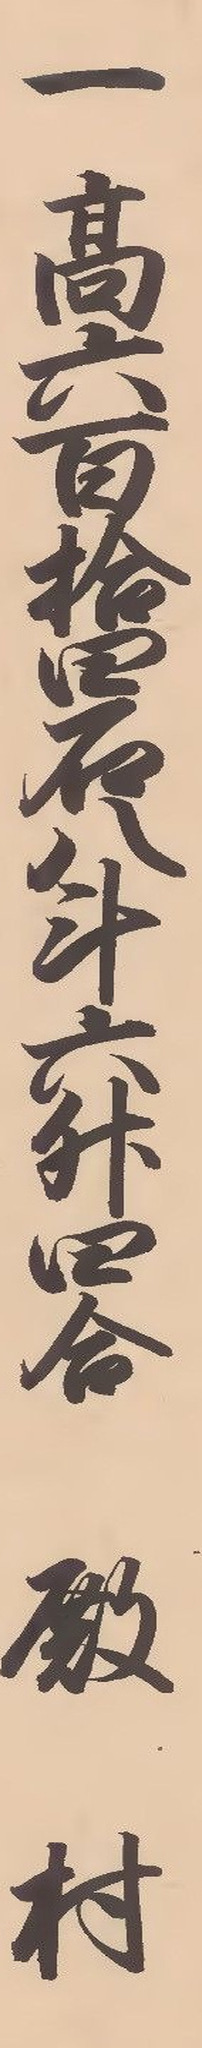一高六百拾四石八斗六升四合殿村
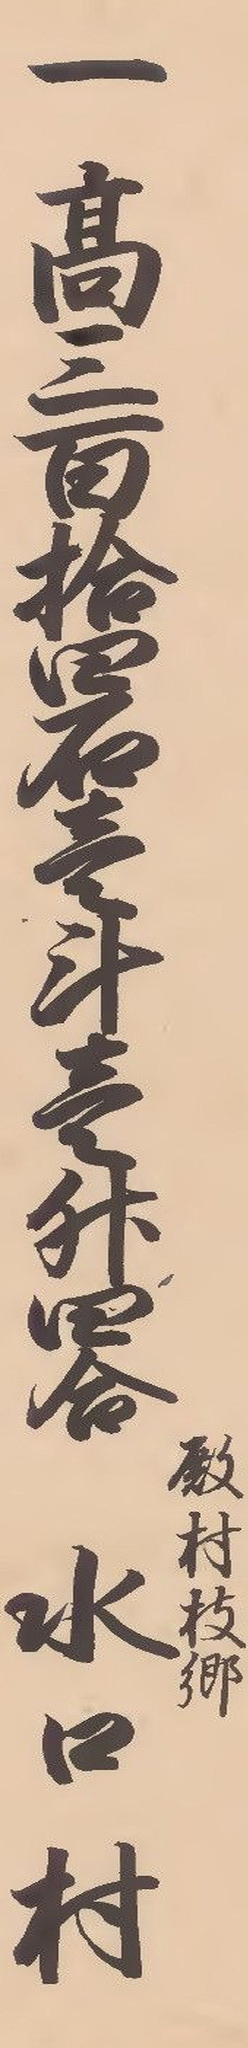一高六百拾四石八斗六升四合殿村
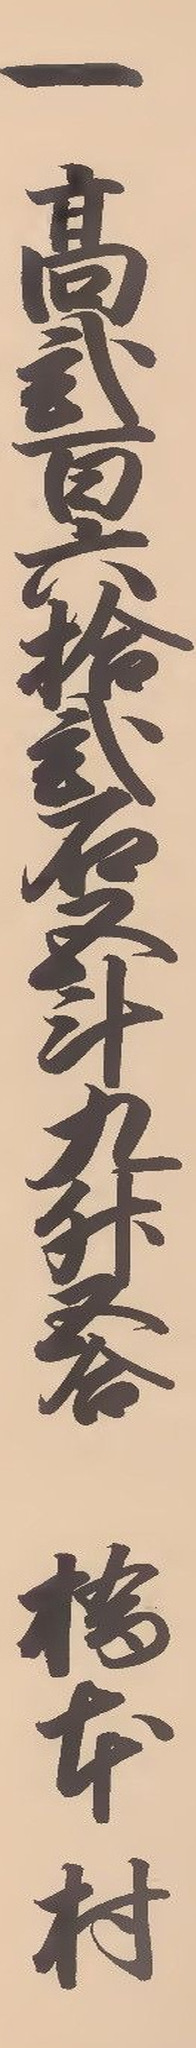一高弐百六拾弐石五斗九升五合橋本村
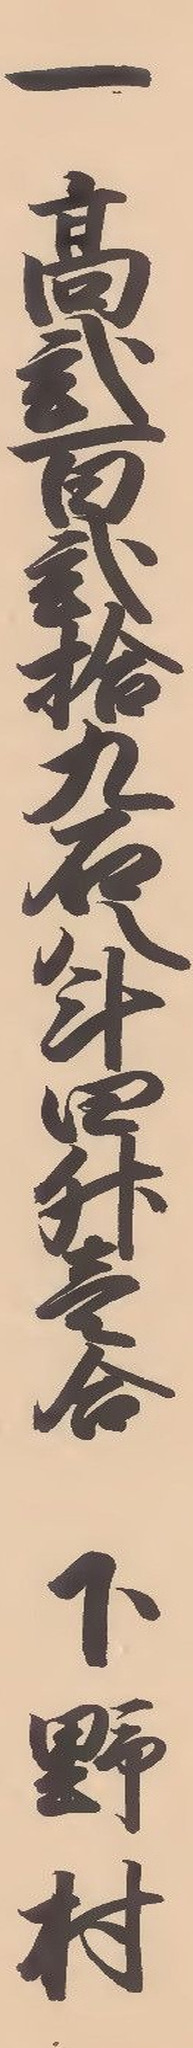一高弐百弐拾九石八斗四升壱合下野村
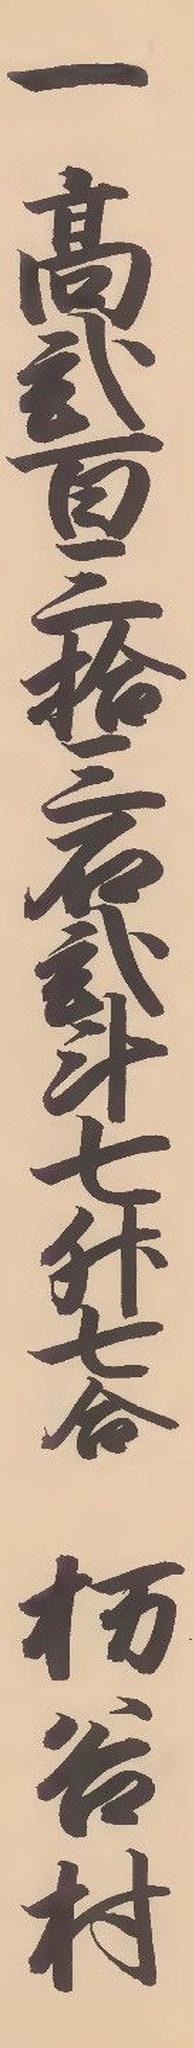一高弐百三拾三石弐斗七升七合栃谷村
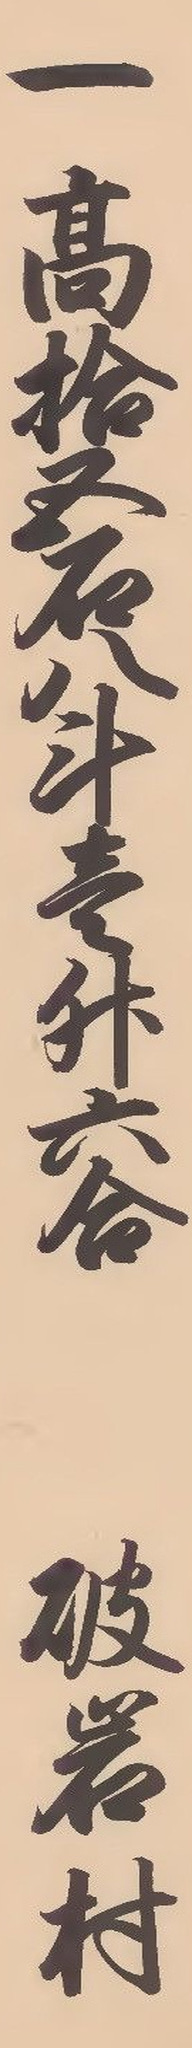一高拾五石八斗壱升六合破岩村

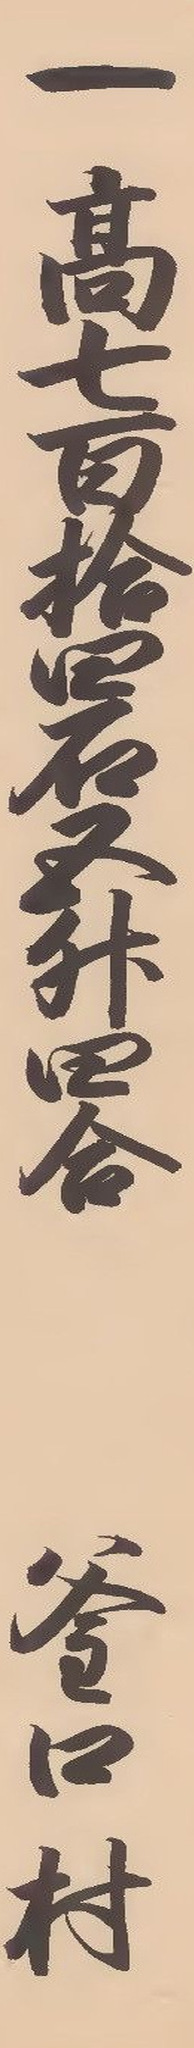一高七百拾四石五升四合釜口村
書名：因幡国郷帳
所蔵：国立公文書館 National Archives of Japan
